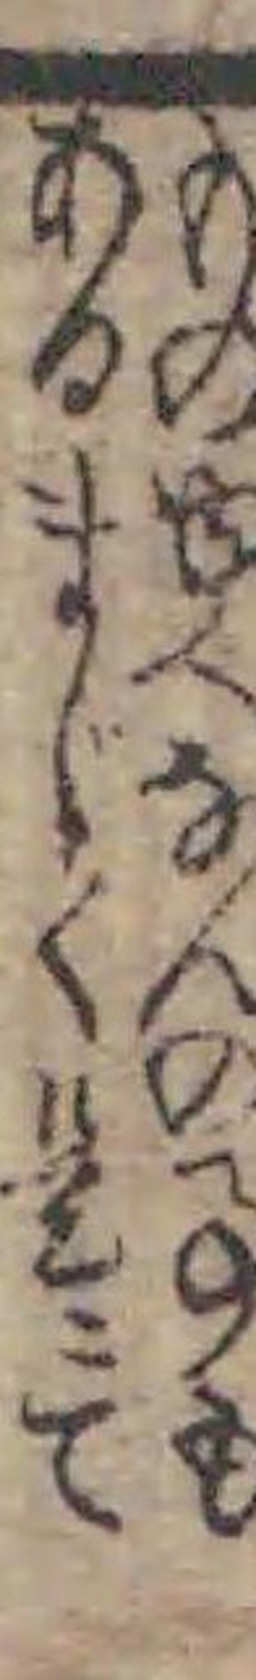あるまじく是にて
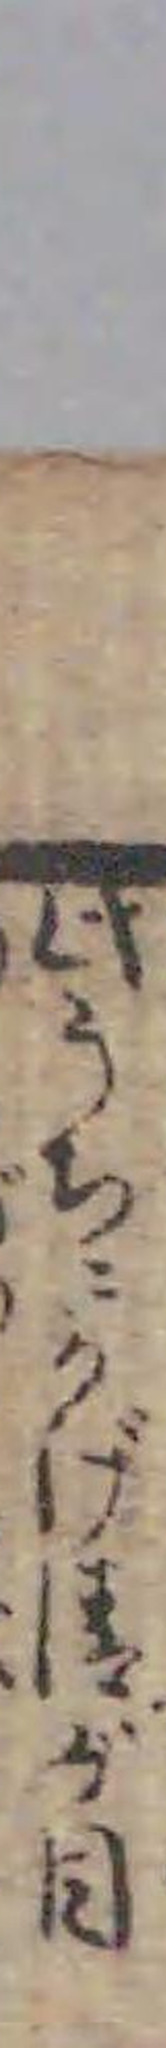此うちにかげ清が目
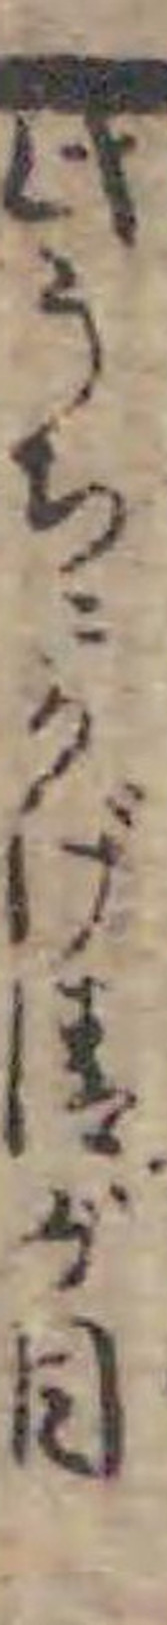此うちにかげ清が目
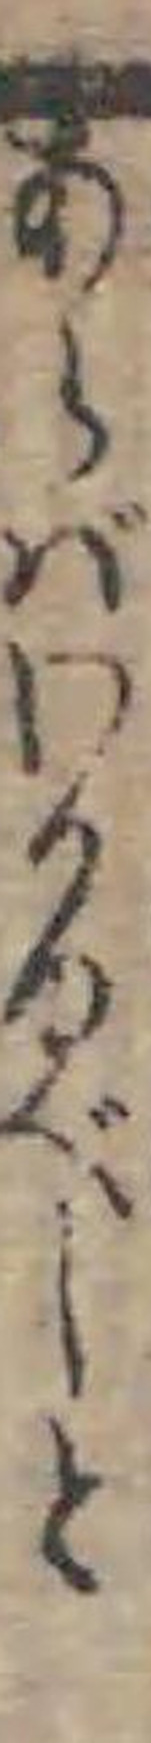あらばわかるべしと
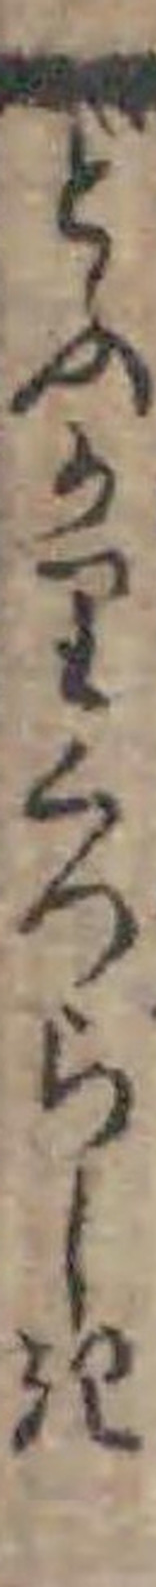どふかりくつらしき
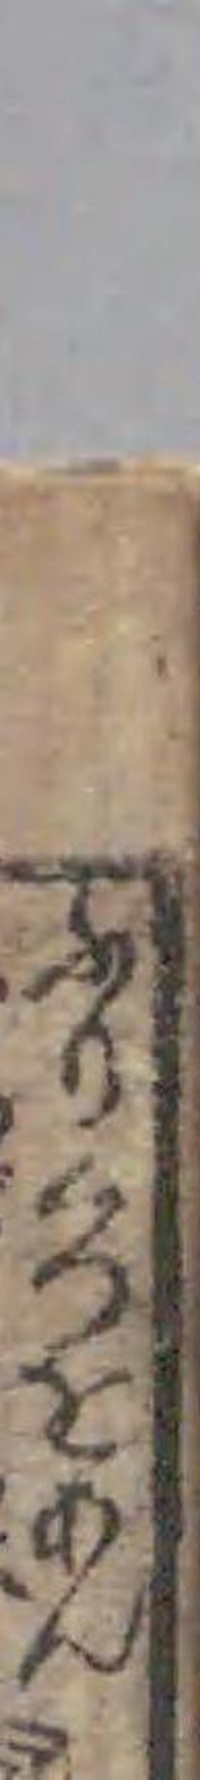ふりくつをあん
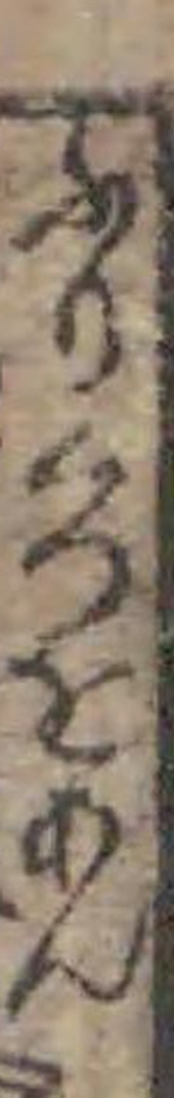ふりくつをあん
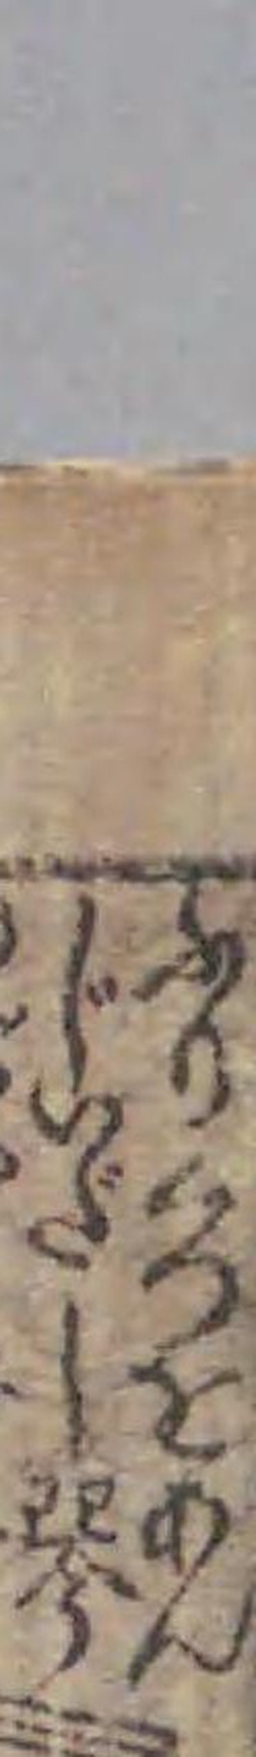じいだし琴
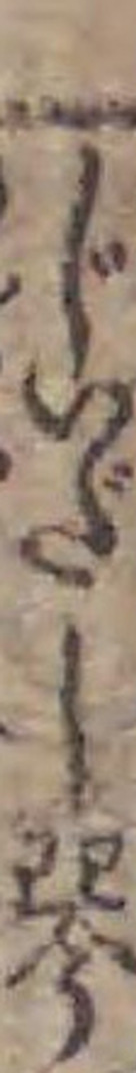じいだし琴
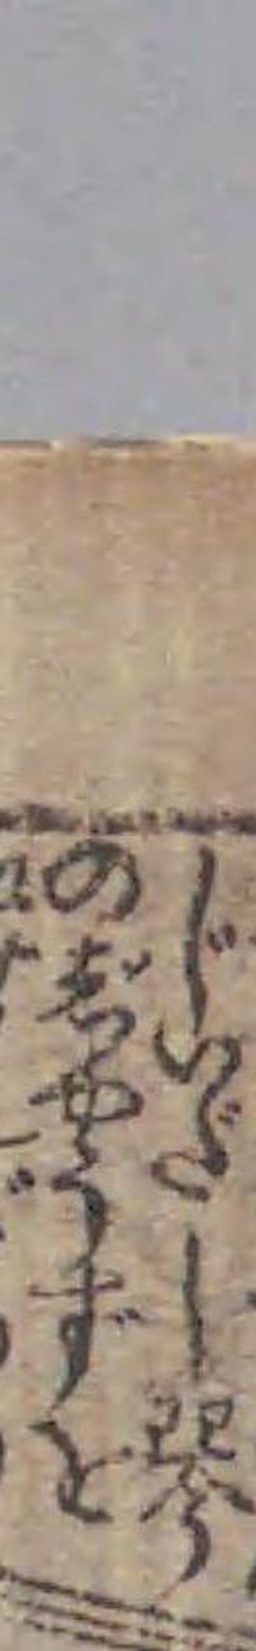のじやうずを
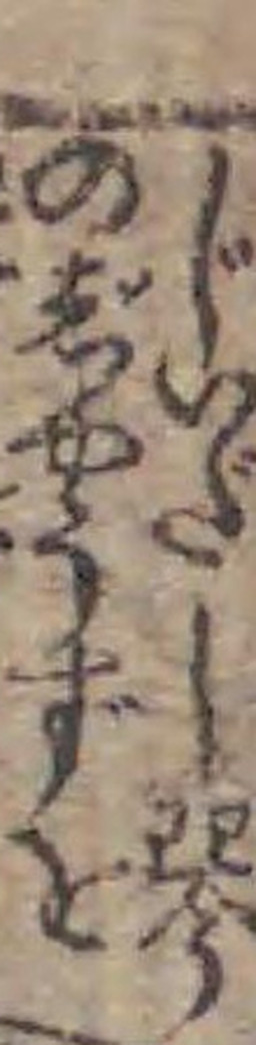のじやうずを
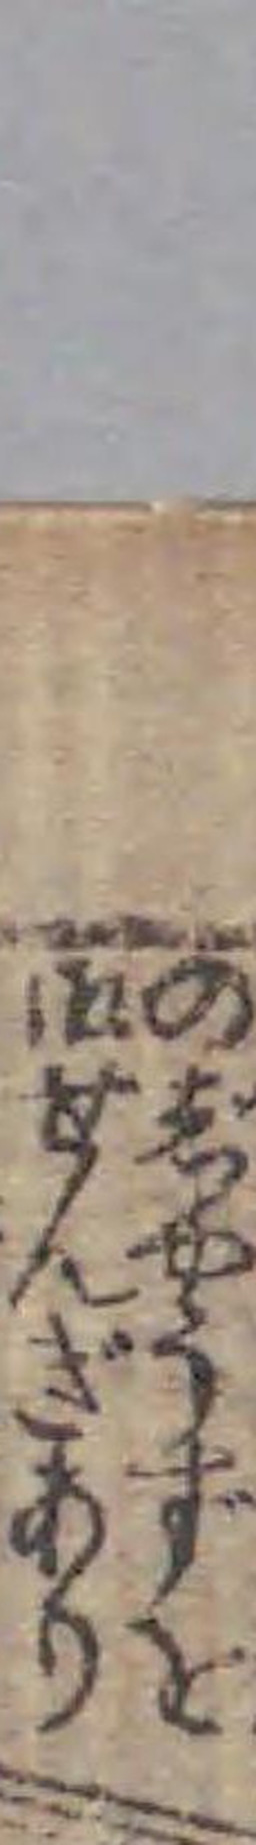御せんぎあり
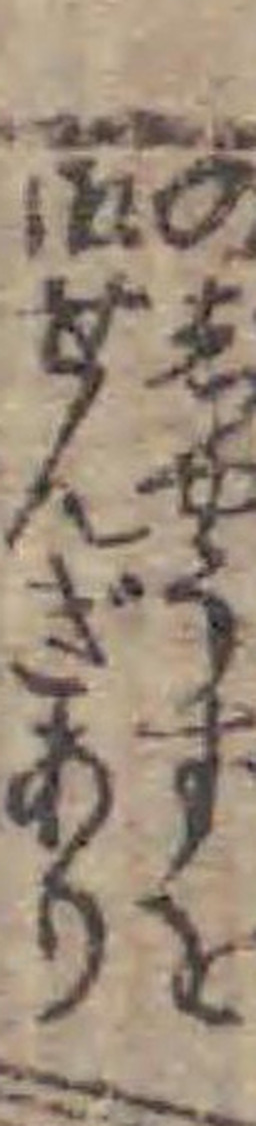御せんぎあり
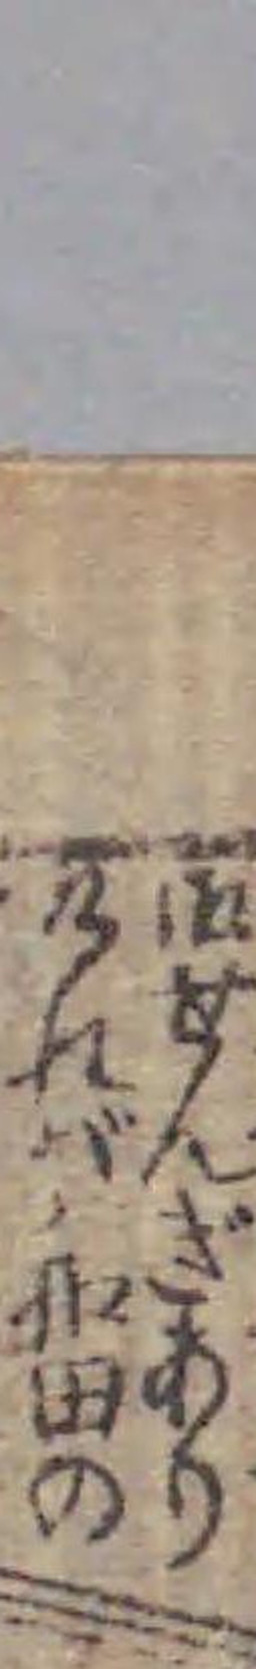ければ和田の
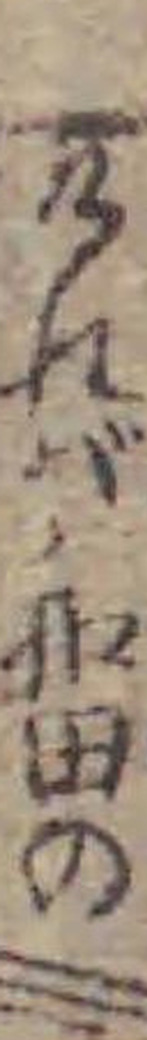ければ和田の
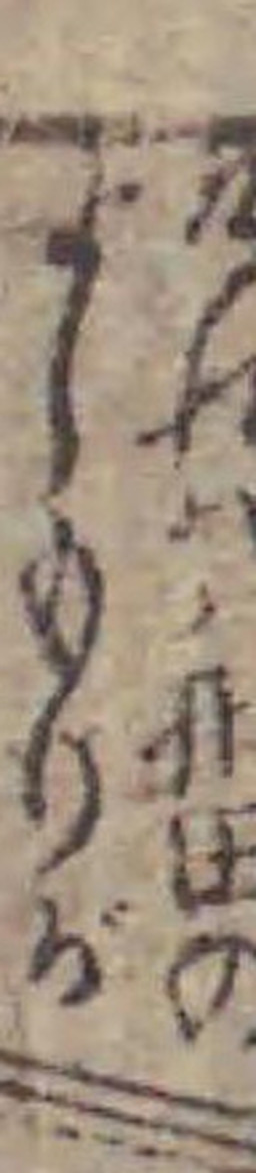よしもりが
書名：悪七変目景清 : 2巻
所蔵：国立国会図書館 National Diet Library, JAPAN
